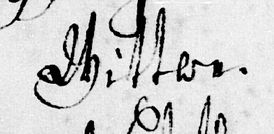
Wittwe.
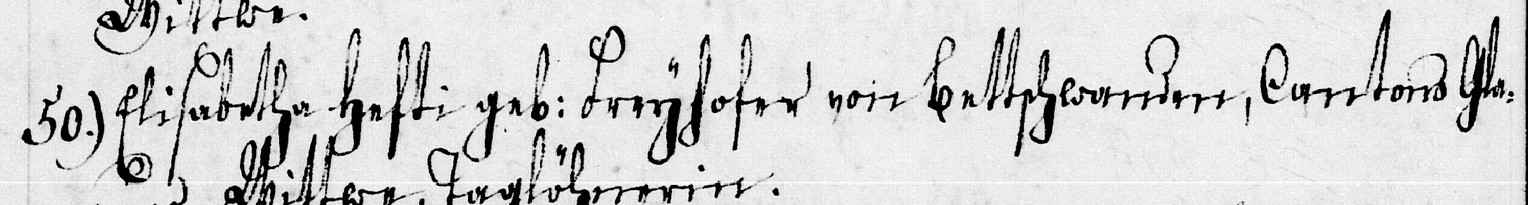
50.) Elisabetha Hefti geb. Freyhofer von Bettschwanden, Cantons Gl¬
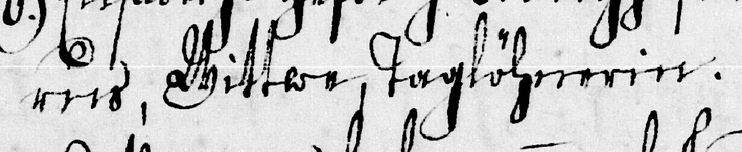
arus, Wittwe, Taglöhnerin.
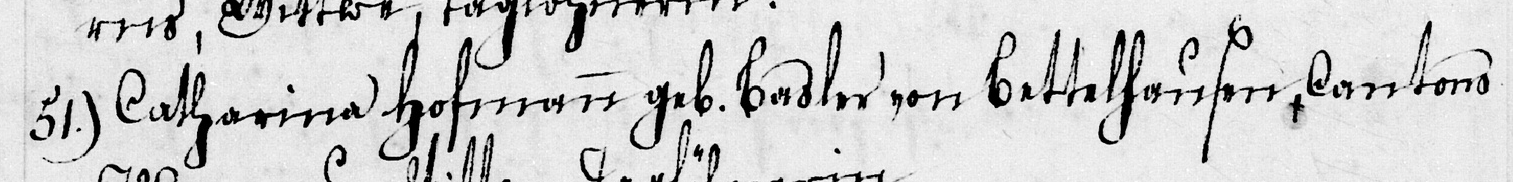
51.) Catharina Hofmann geb. Basler von Bettelhausen, Cantons
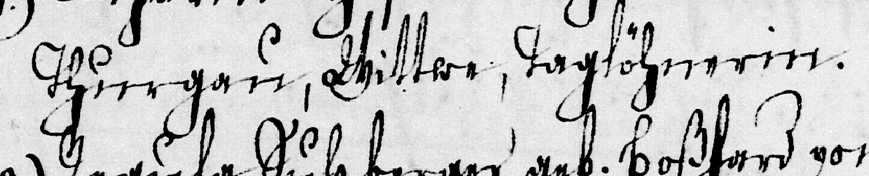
Thurgau, Wittwe, Taglöhnerin.
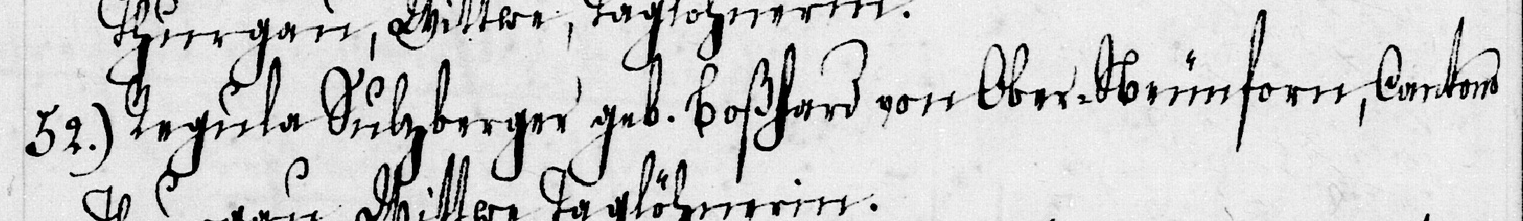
52.) Regula Sulzberger geb. Boßhard von Ober-Neunforn, Cantons
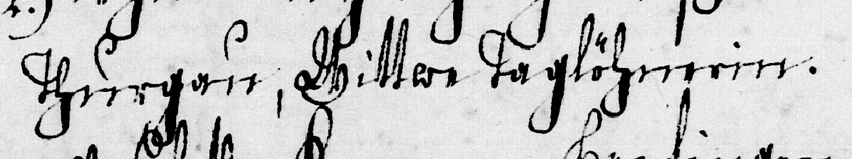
Thurgau, Wittwe Taglöhnerin.
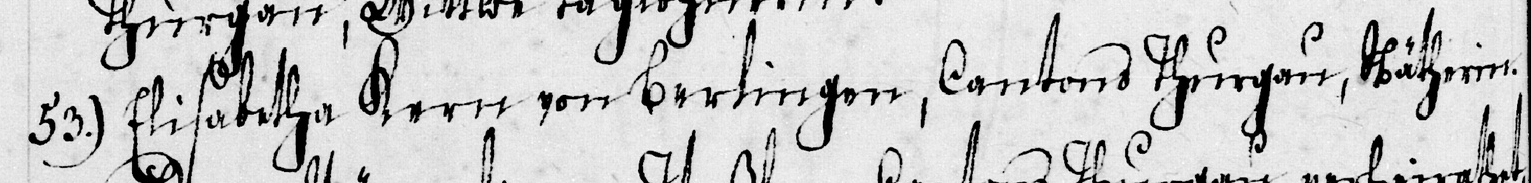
53.) Elisabetha Kern von Berlingen, Cantons Thurgau, Nätherin.
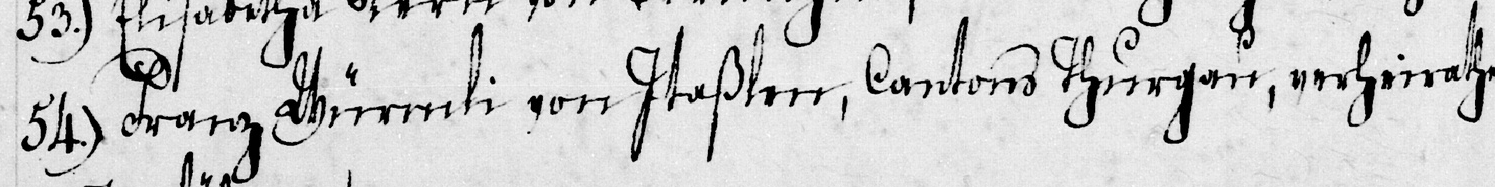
54.) Franz Würmli von Itaßlen, Cantons Thurgau, verheirat¬
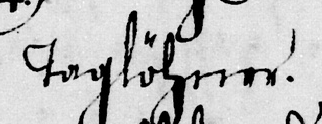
Taglöhner.
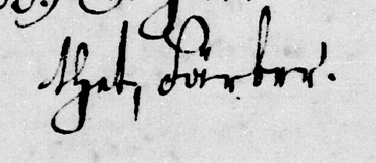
thet, Färber.
